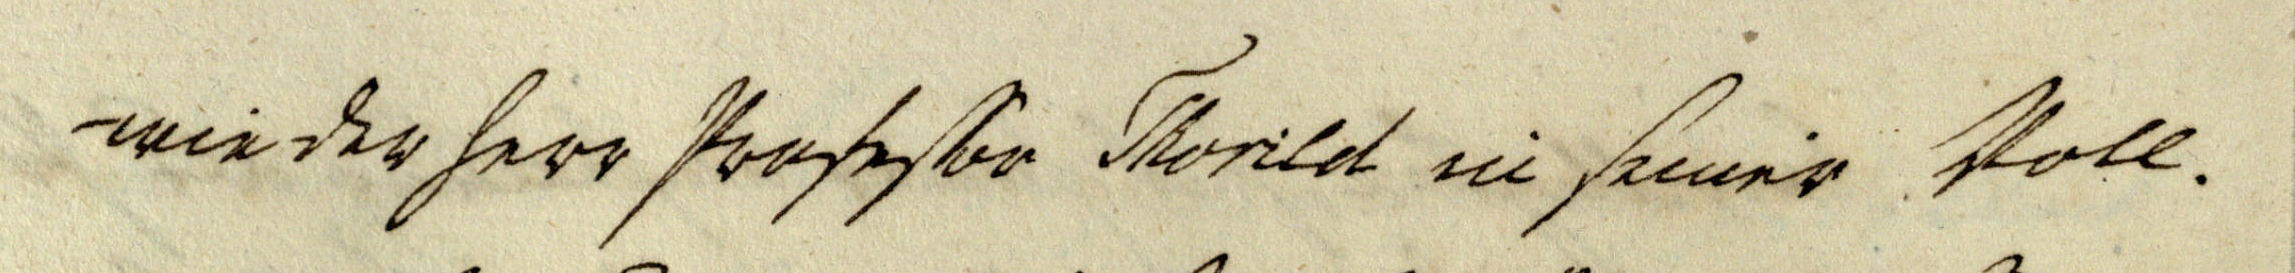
wie der Herr Professor Thorild in seiner Voll¬
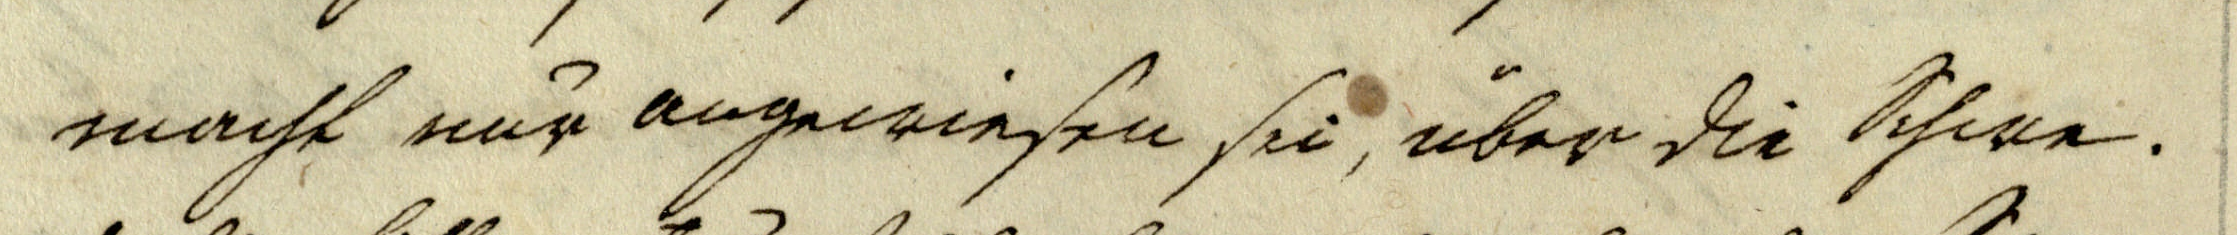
macht nur angewiesen sei, über die Schwe¬
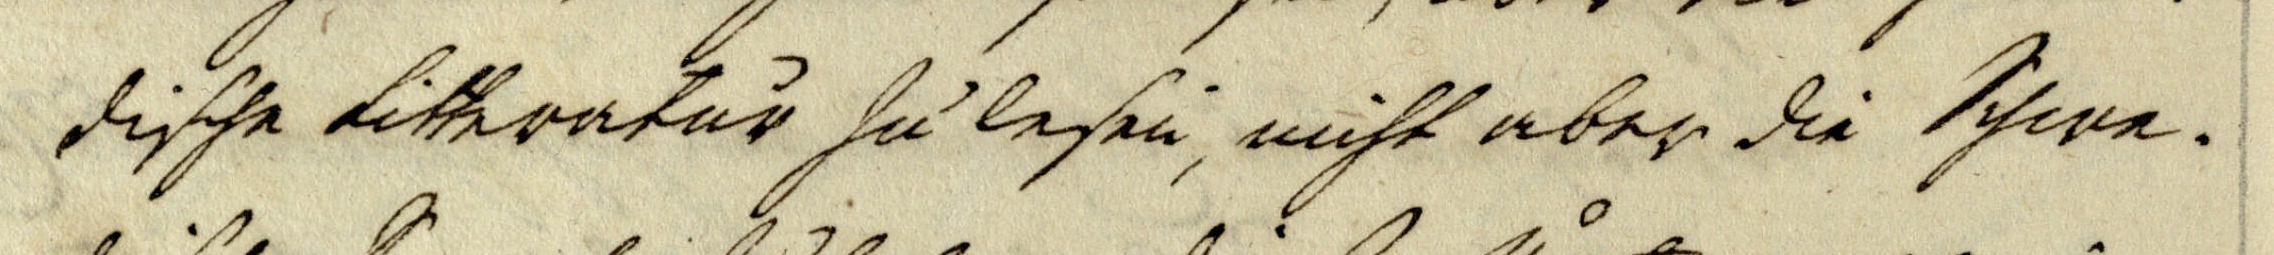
dische Litteratur zu lesen, nicht aber die Schwe¬
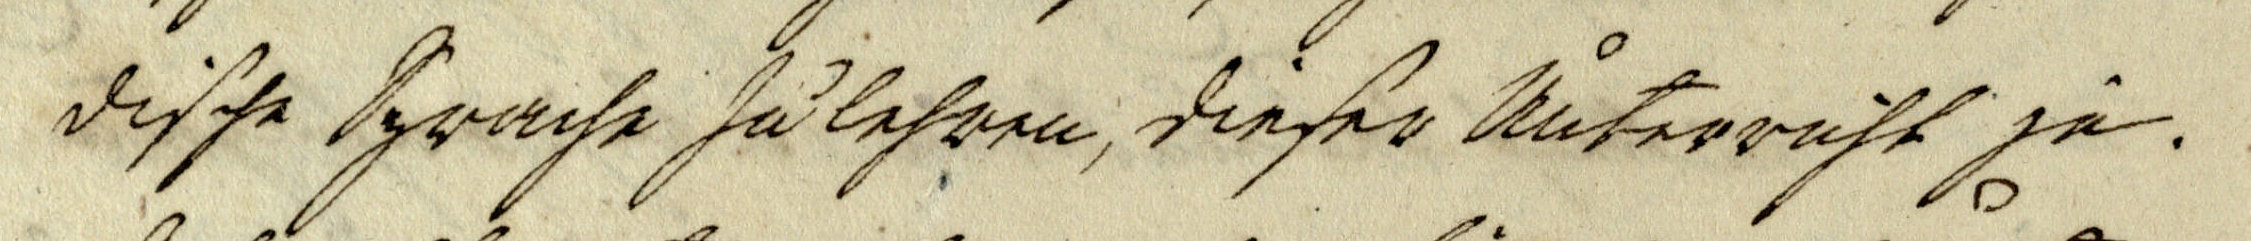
dische Sprache zu lehren, dieser Unterricht je¬
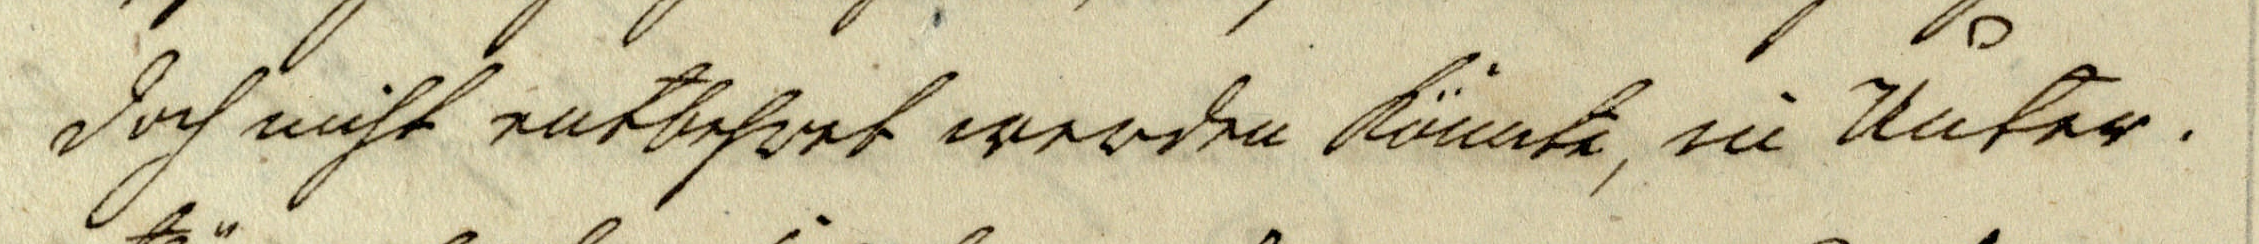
doch nicht entbehret werden könnte, in Unter¬
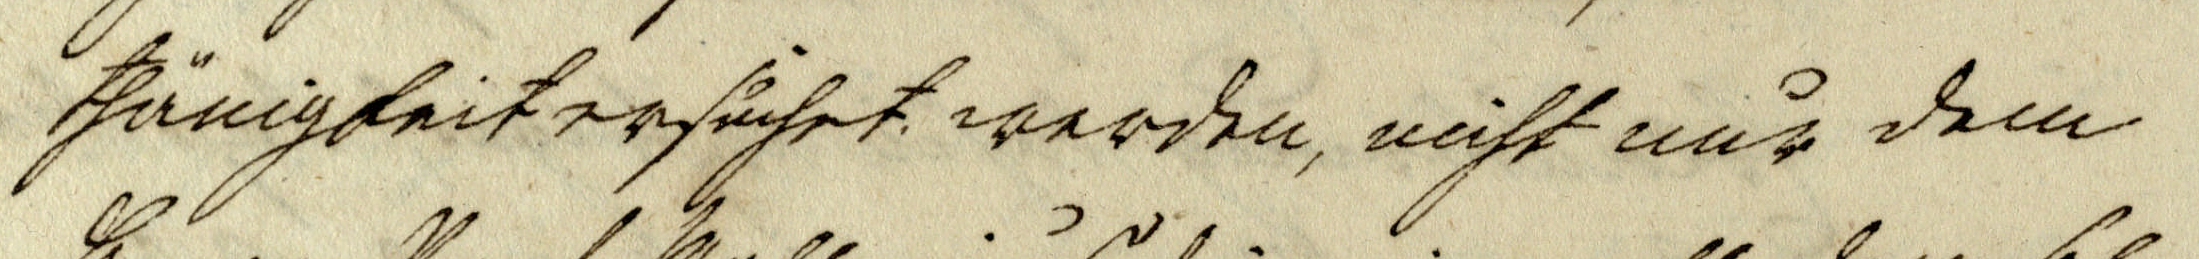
thänigkeit ersuchet werden, nicht nur dem
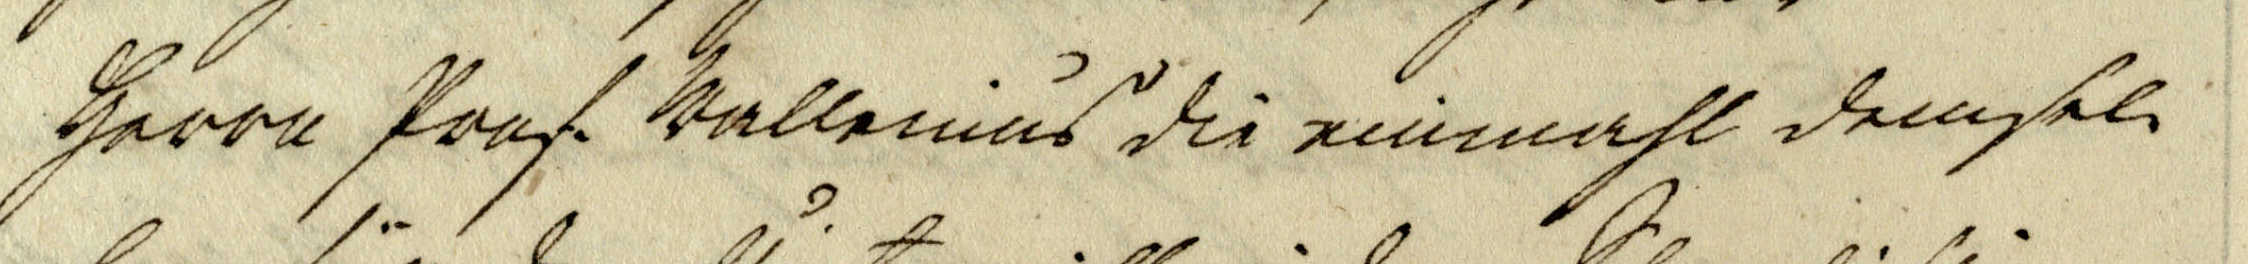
Herrn Prof. Wallenius die einmahl demsel¬
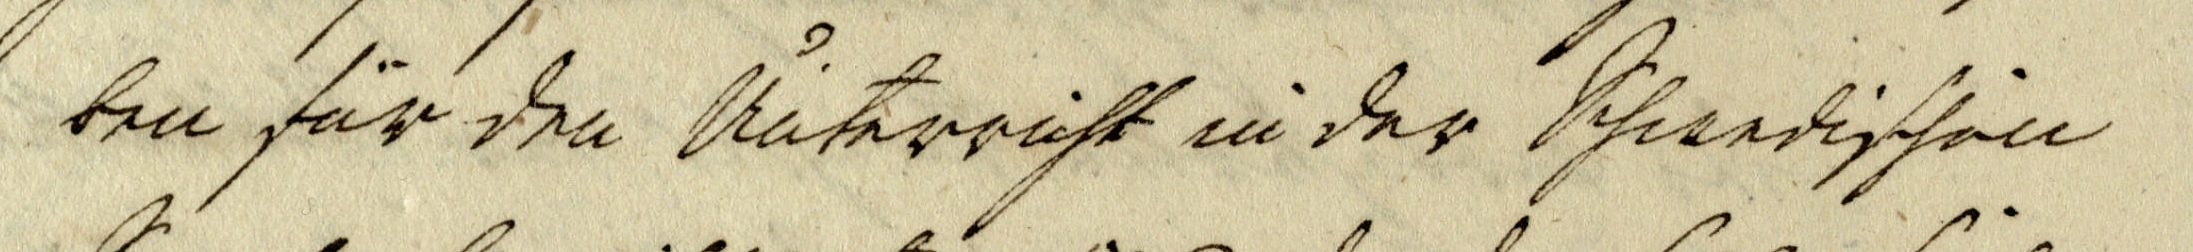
ben für den Unterricht in der Schwedischen
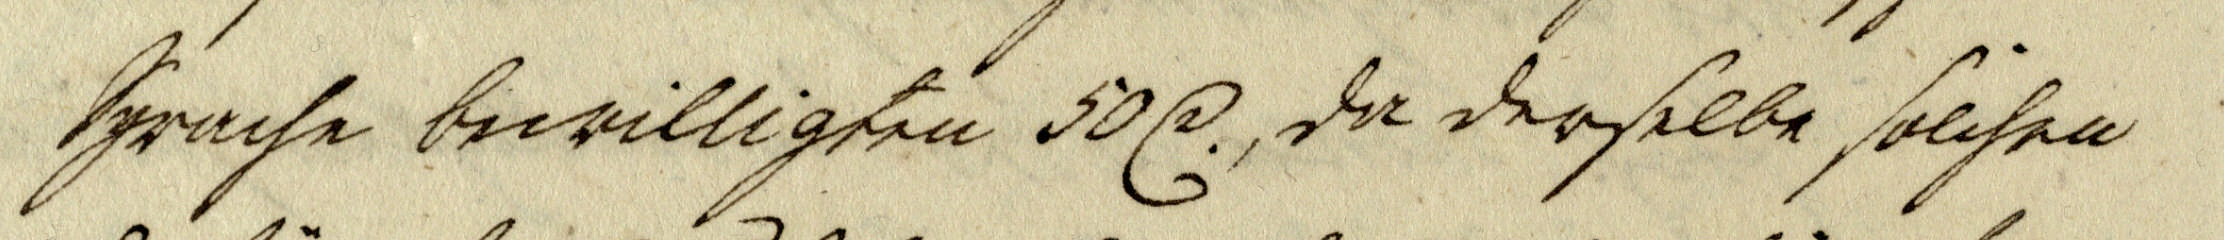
Sprache bewilligten 50 l., da derselbe solchen
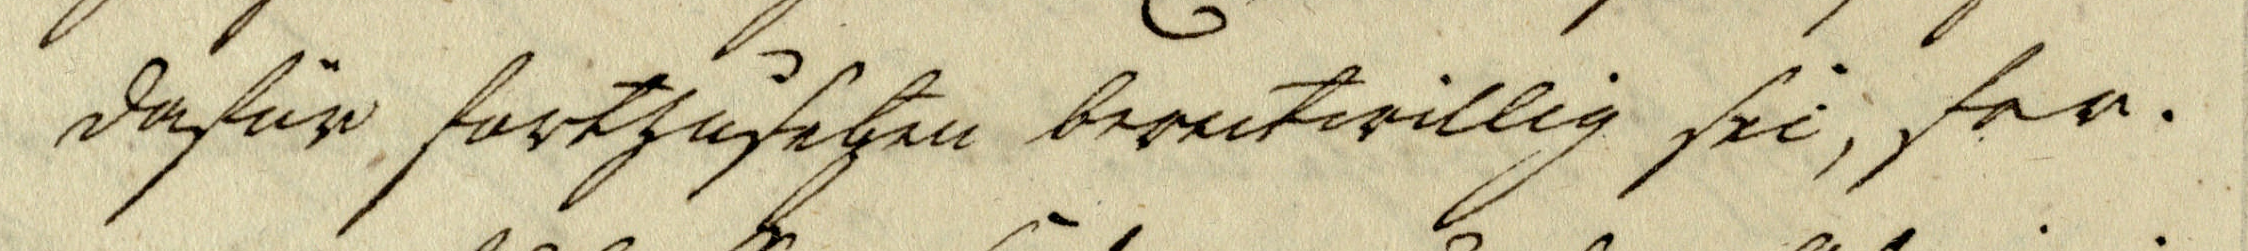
dafür fortzusetzen bereitwillig sei, fer¬
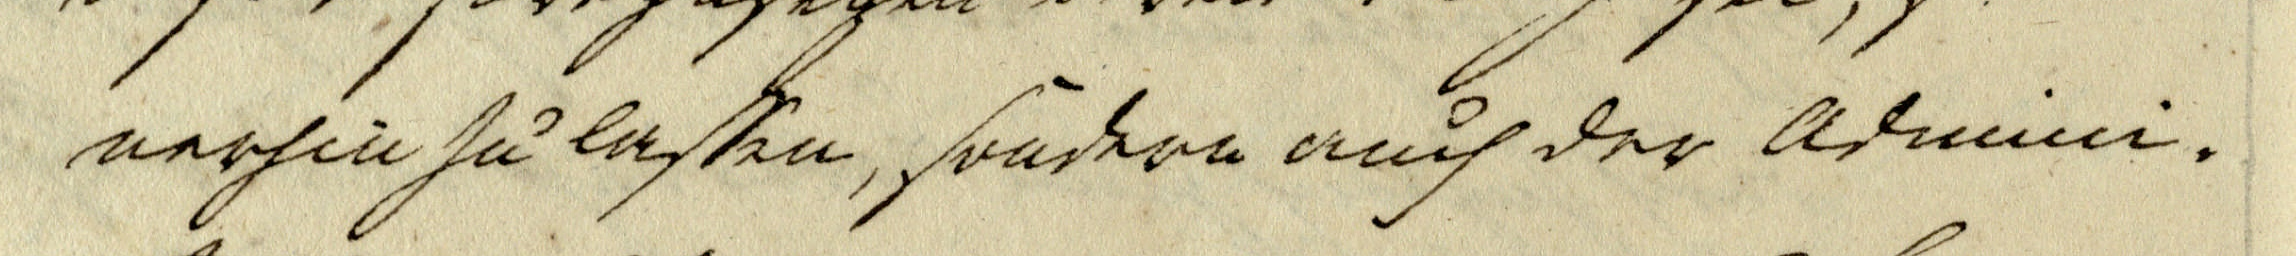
nerhin zu lassen, sondern auch der Admini¬
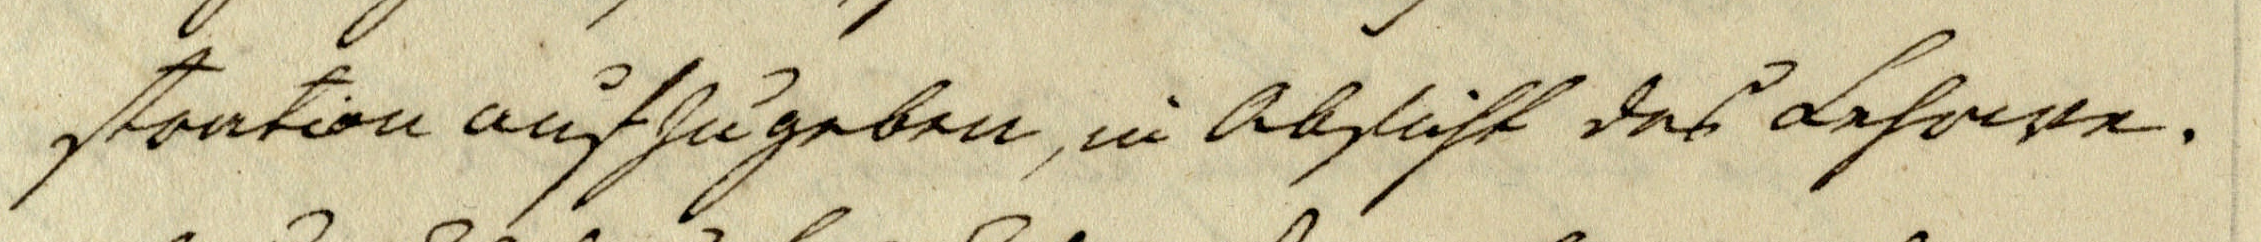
stration aufzugeben, in Absicht des Lehrwe¬
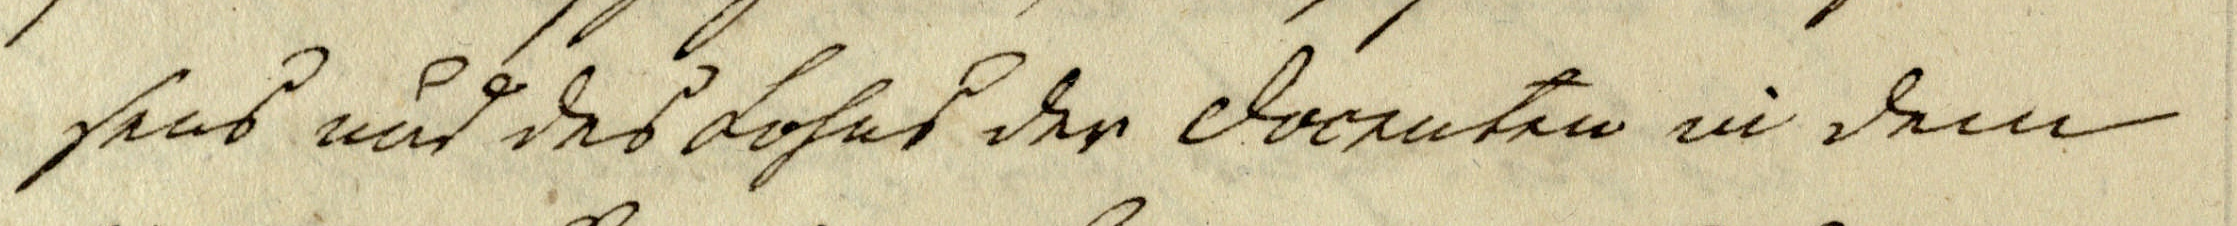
sen und des Lohns der Docenten in dem
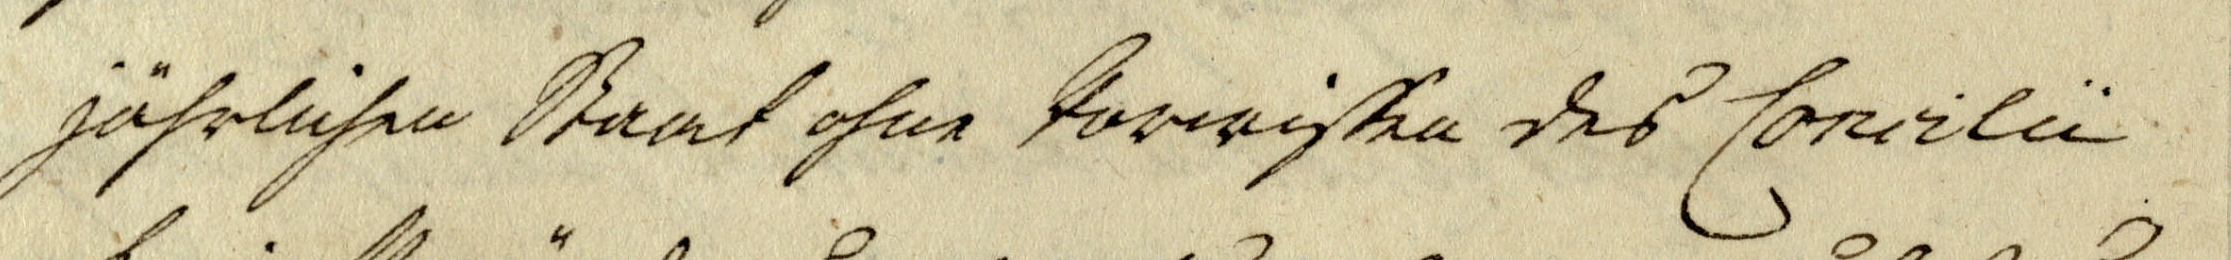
jährlichen Staat ohne Vorwissen des Concilii
